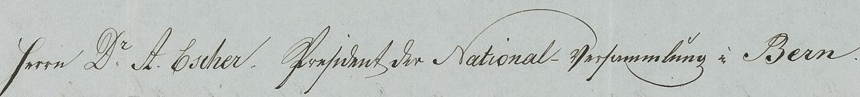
Herrn Dr A. Escher. President der National-Versammlung in Bern.
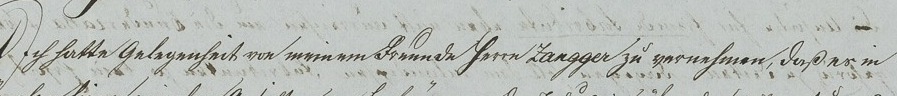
Ich hatte Gelegenheit von meinem Freunde Herrn Zangger zu vernehmen, daß es in
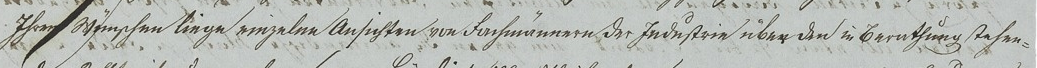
Ihren Wünschen liege einzelne Ansichten von Fachmännern der Industrie über den in Berathung stehen-
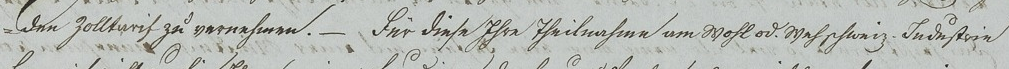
den Zolltarif zu vernehmen. – Für diese Ihre Theilnahme am Wohl od. Weh schweiz. Industrie
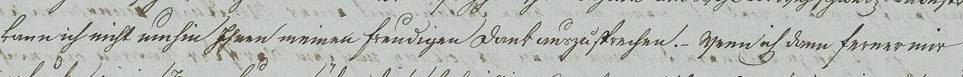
kann ich nicht umhin Ihnen meinen freudigen Dank auszusprechen. – Wenn ich dann ferner mir
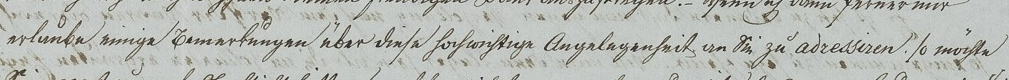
erlaube, einige Bemerkungen über diese hochwichtige Angelegenheit an Sie zu adressiren, so möchte
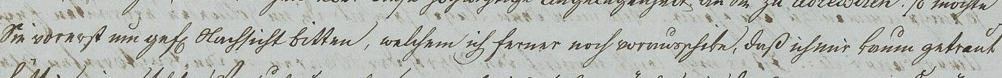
Sie vorerst um gefällige Nachsicht bitten, welchem ich ferner noch vorausschike, daß ich mir kaum getraut
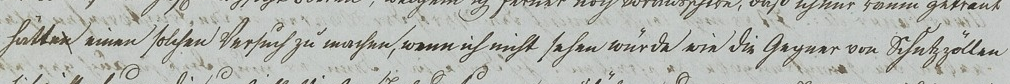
hätten einen solchen Versuch zu machen, wenn ich nicht sehen würde wie die Gegner von Schutzzöllen
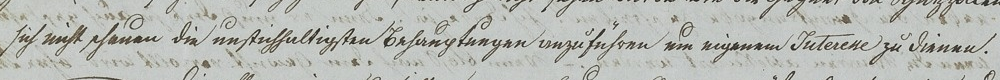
sich nicht scheuen die unstichhaltigsten Behauptungen anzuführen um eigenem Interesse zu dienen.
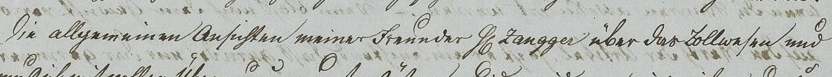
Die allgemeinen Ansichten meines Freundes HerrnZangger über das Zollwesen und
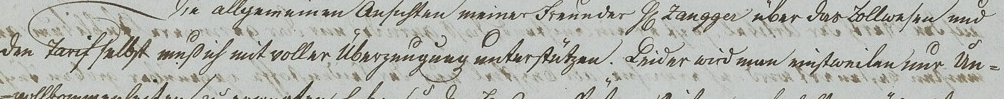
den Tarif selbst muß ich mit voller Überzeugung unterstützen. Leider wird man einstweilen nur Un-
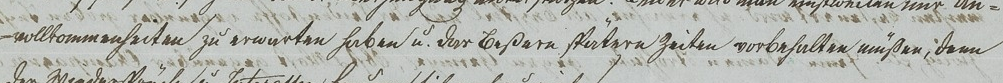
vollkommenheiten zu erwarten haben u. das Beßere spätern Zeiten vorbehalten müssen; denn
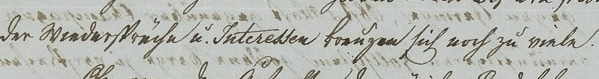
der Wiedersprüche u. Interessen kreuzen sich noch zu viele.
